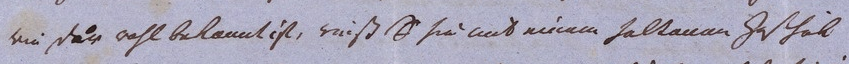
wie Dir wohl bekannt ist, weiß sie mit einem seltenen Geschick
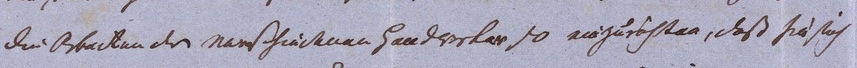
die Arbeiten der verschiedenen Handwerker so einzurichten, daß sie sich
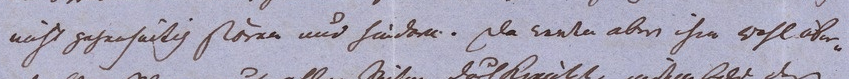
nicht gegenseitig stören und hindern. Da werden aber ihre wohl über-
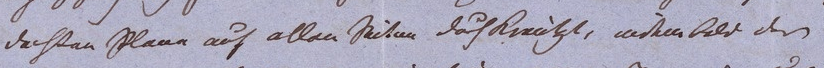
dachten Plane auf allen Seiten durchkreutzt, indem bald der
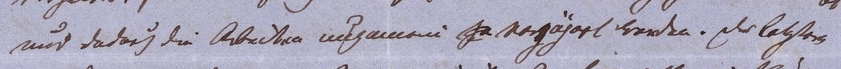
und dadurch die Arbeiten ungemein verzögert werden. Der letztere
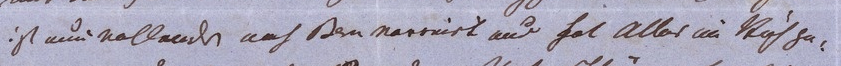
ist nun vollends nach Bern verreist und hat Alles im Stich ge-
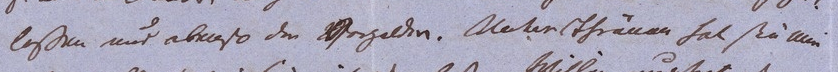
laßen und ebenso der Vergolder. Unter Thränen hat sie mir
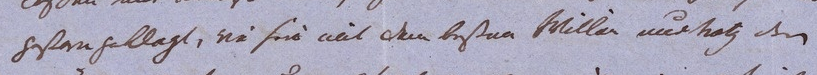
gestern geklagt, wie sie mit dem besten Willen und trotz der
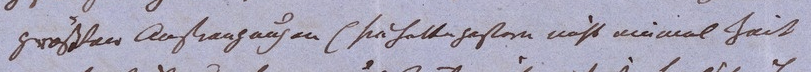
größten Anstrengungen (sie hatte gestern nicht einmal Zeit
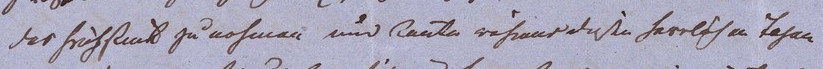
das Frühstück zu nehmen und konnte während diesen herrlichen Tagen
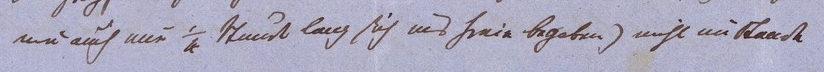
nie auch nur ¼ Stunde lang sich ins Freie begeben) nicht im Stande
